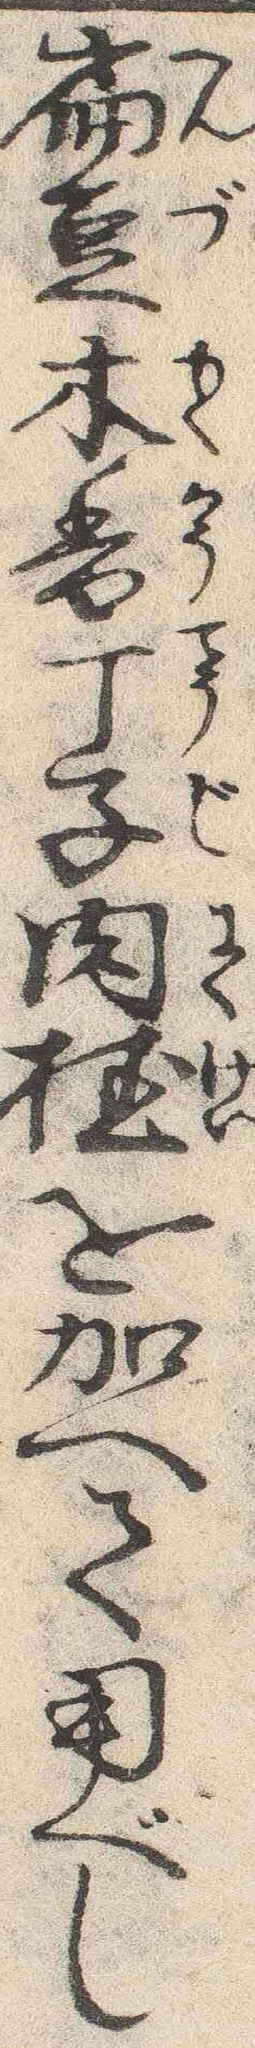扁豆木香丁子肉桂を加へて用べし
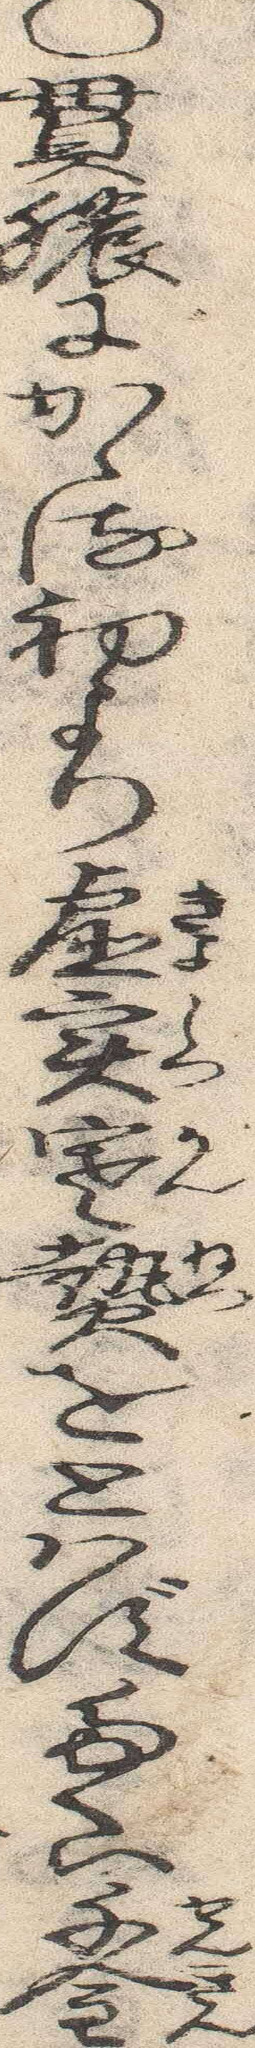○貫膿にかゝる初より虚実寒熱をとはず多くは千金
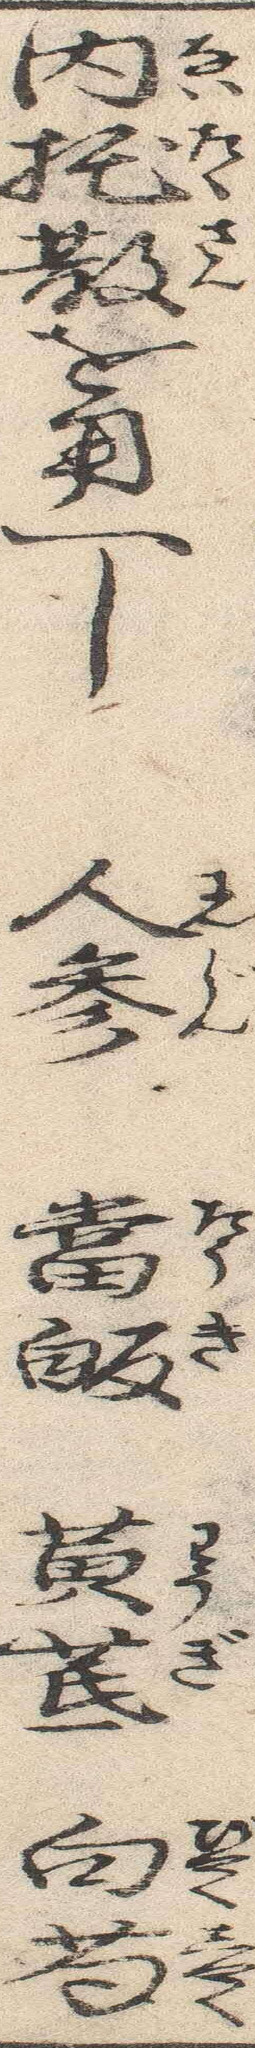内托散を用へし人参当皈黄茋白芍
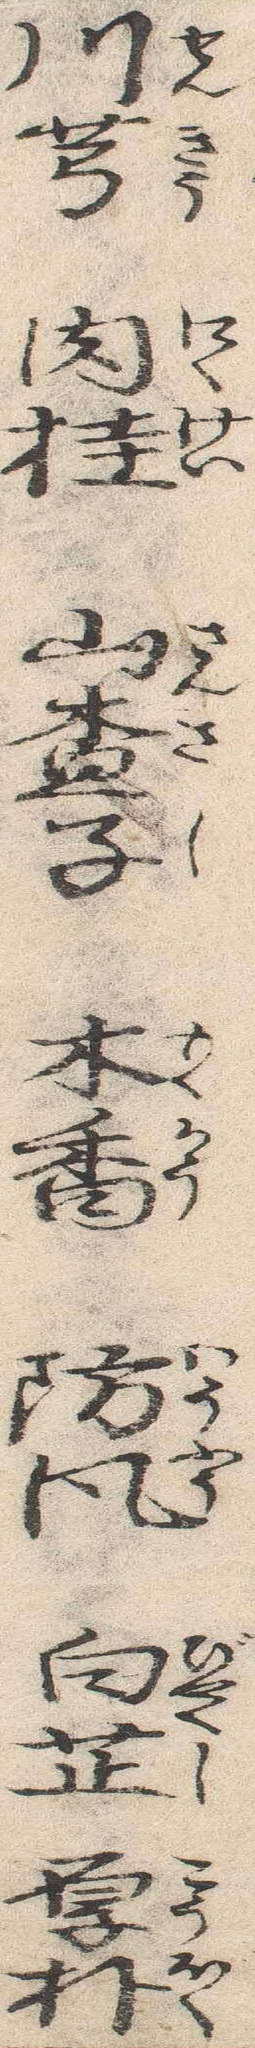川芎肉桂山査子木香防風白芷厚朴
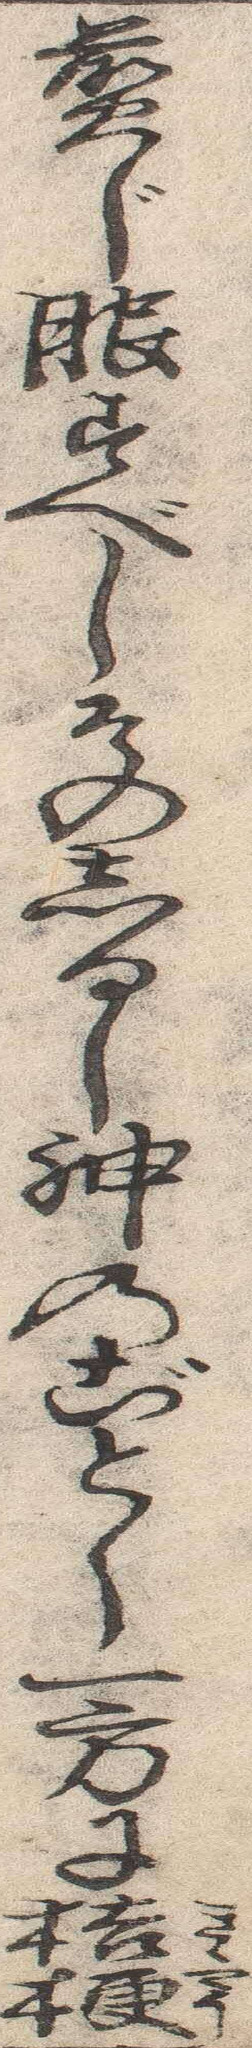煎じ服すべしそのしるし神のごとし一方に桔梗
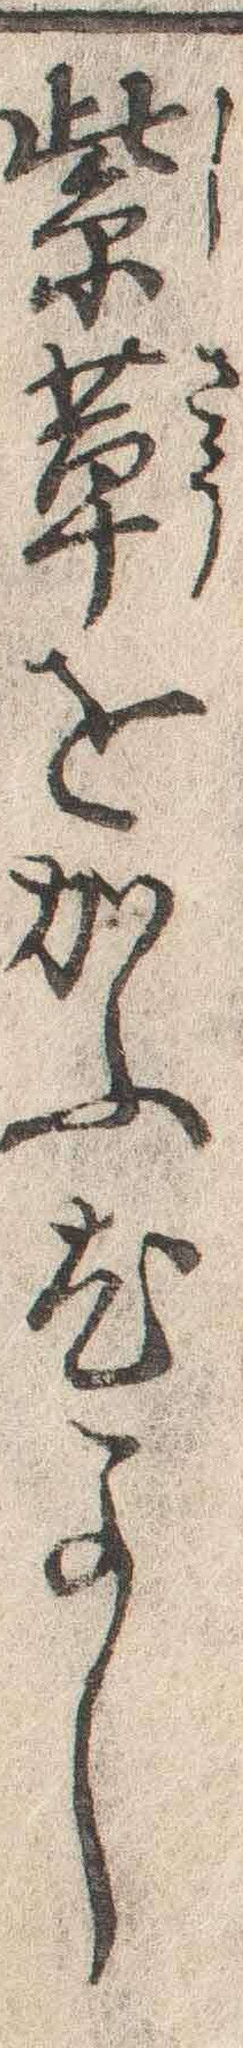紫草を加ふ尤よし
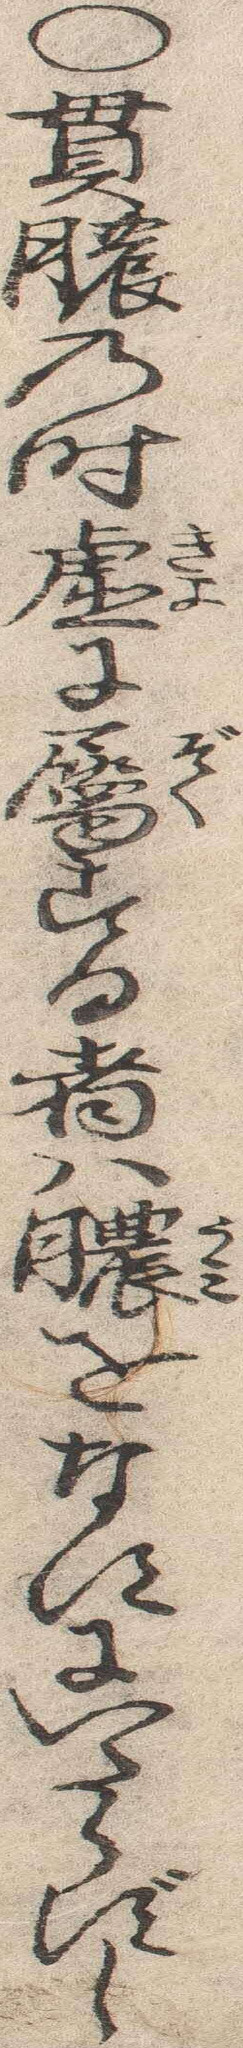○貫膿の時虚に属する者は膿をなすにいたらずし
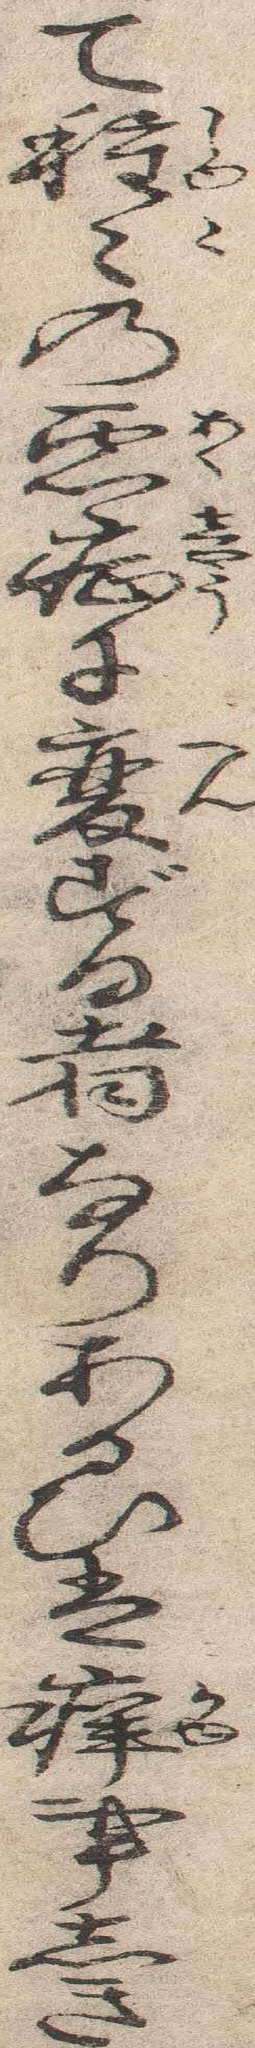て種々の悪症に変ずる者なりあるひは痒事しき

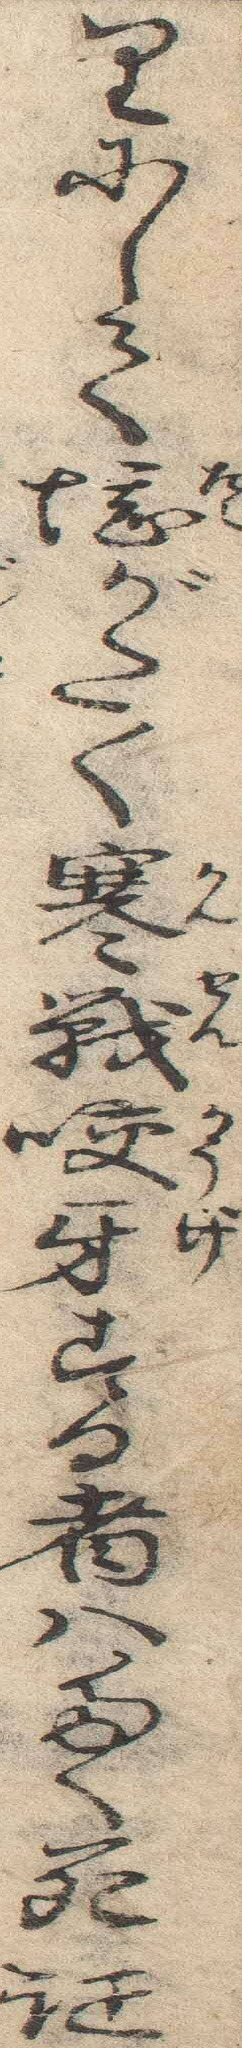りにして堪がたく寒戦咬牙する者は多く死証
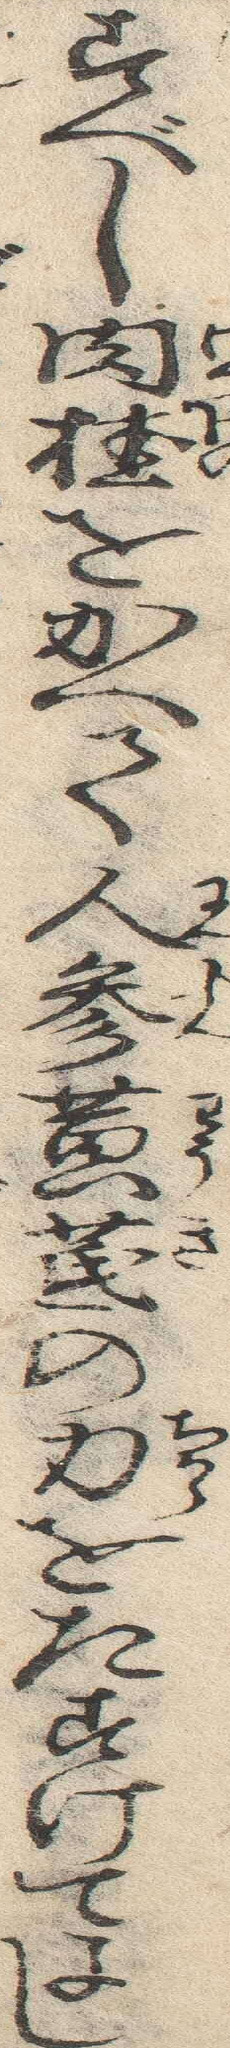すべし肉桂を加へて人参黄茋の力をたすけてよし
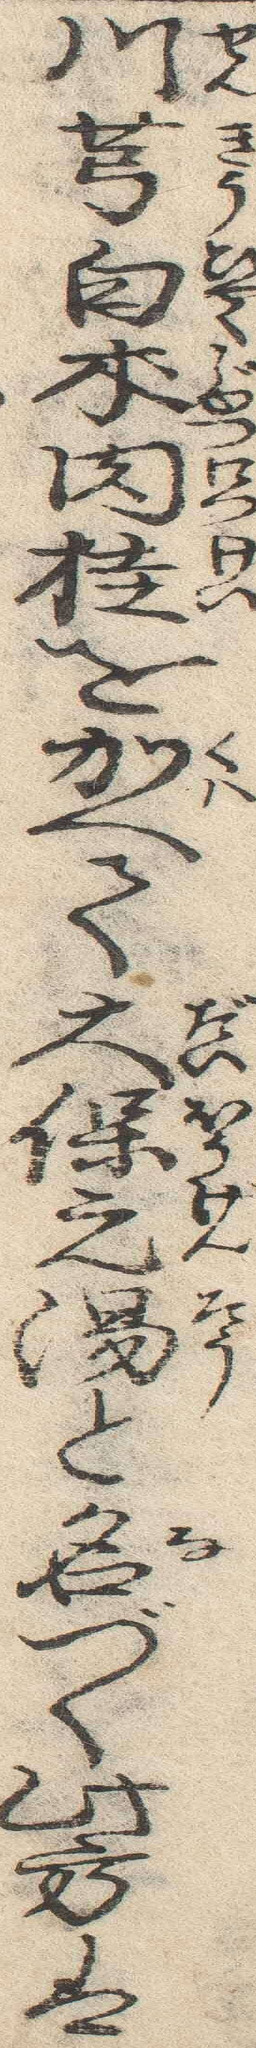川芎白朮肉桂を加へて大保元湯と名づく此方は
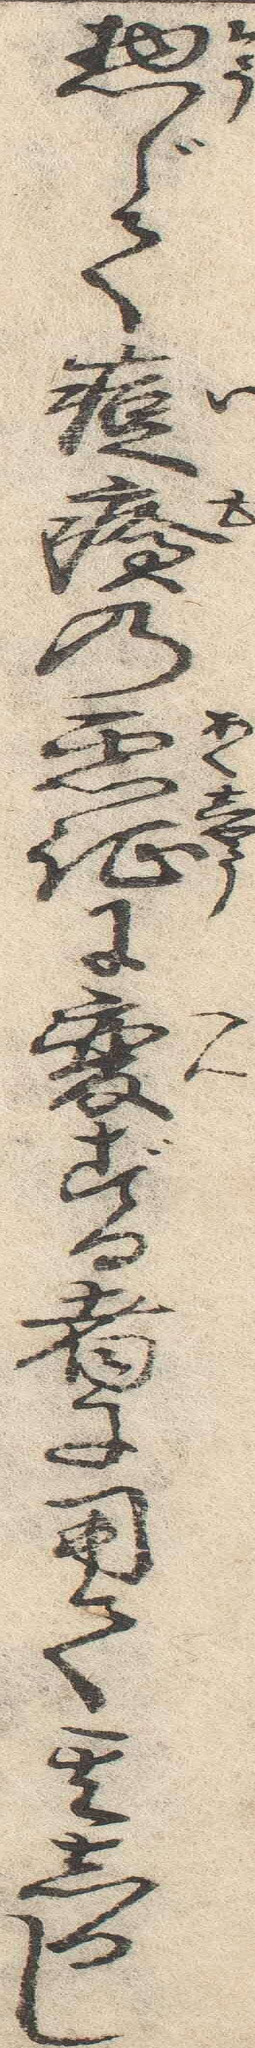総じて痘瘡の悪証に変ずる者に用て其しるし
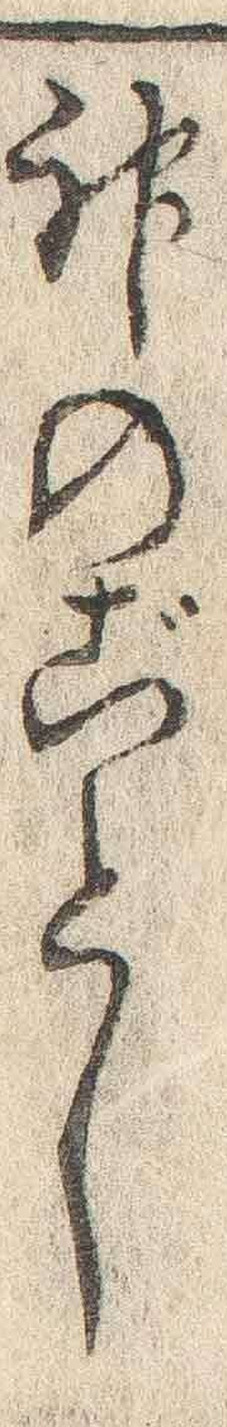神のごとし
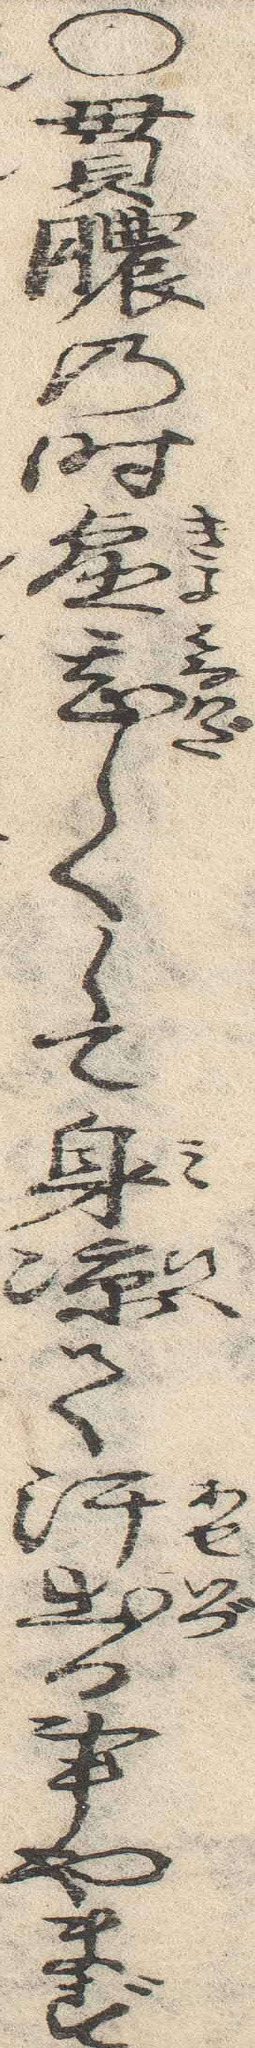○貫膿の時虚甚しくして身涼て汗出る事やまず
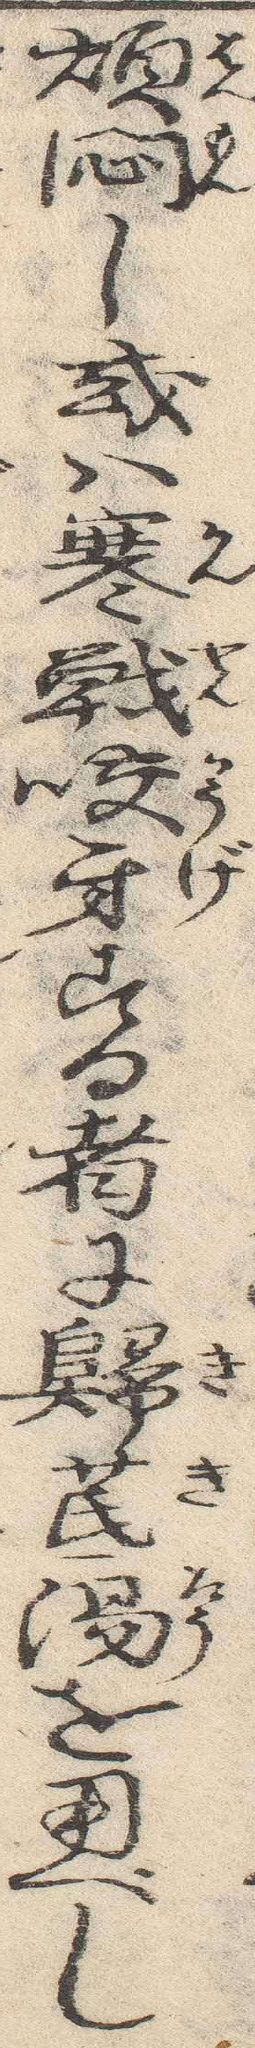煩悶し或は寒戦咬牙する者に帰茋湯を用べし
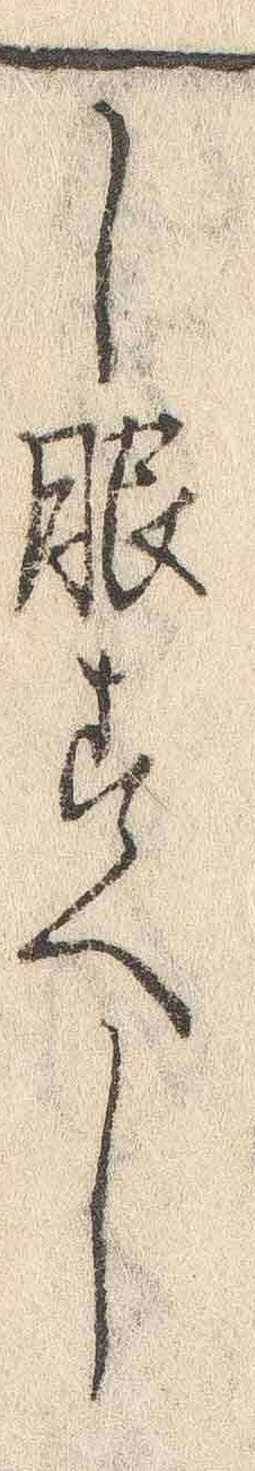し服すへし
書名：小児必用養育草
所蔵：東京学芸大学附属図書館 国文学研究資料館
